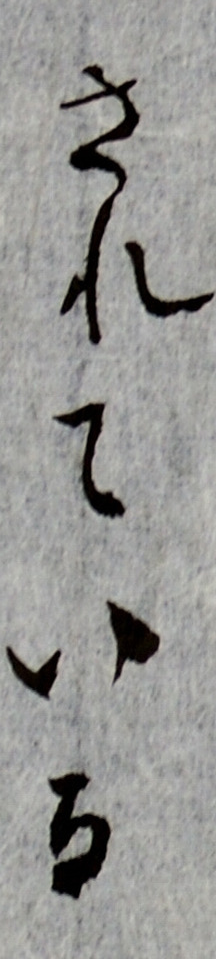されている

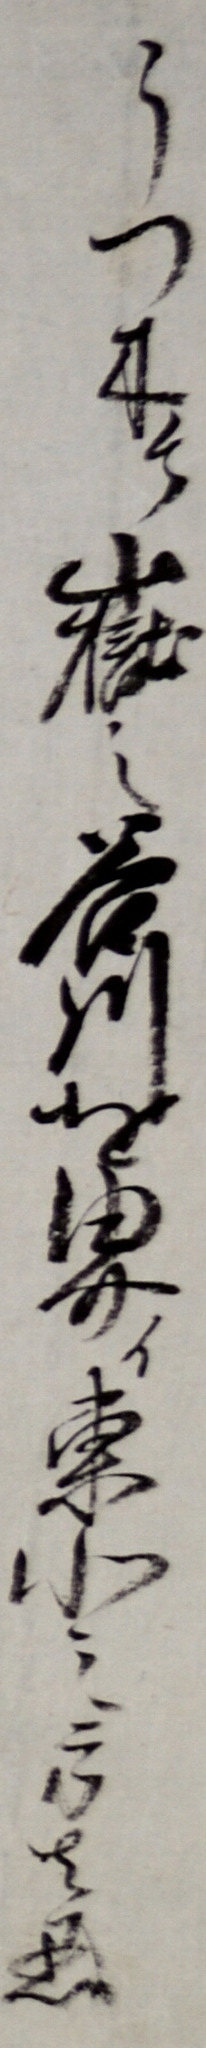うつ木ヶ嶽之谷川を界イ東北之方者黒
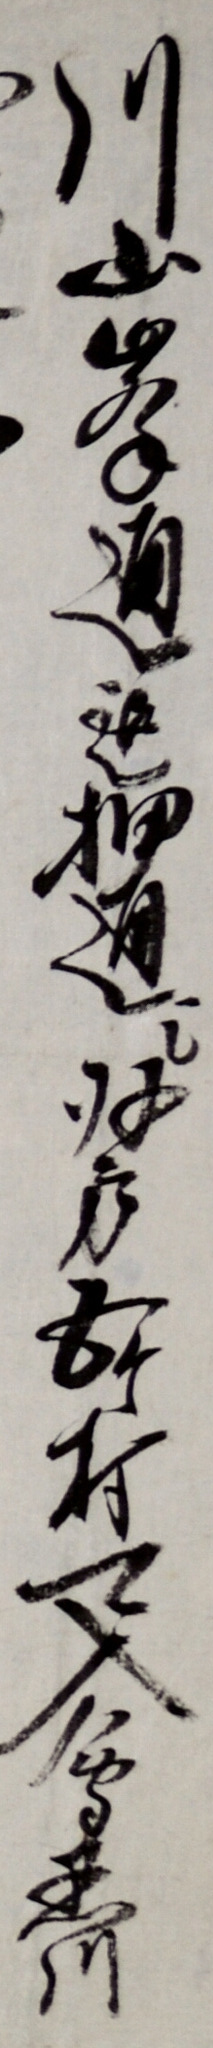川山峯通迄押通し双方五ヶ村可入会黒川
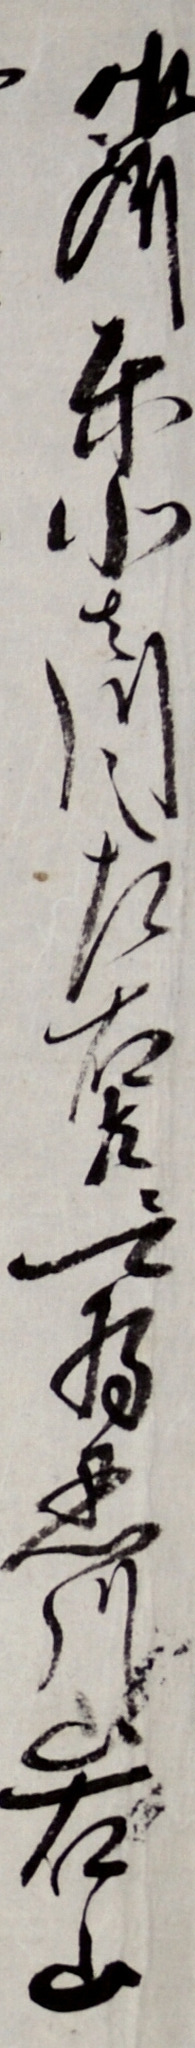御所東北者川之左右共二可為黒川山右山
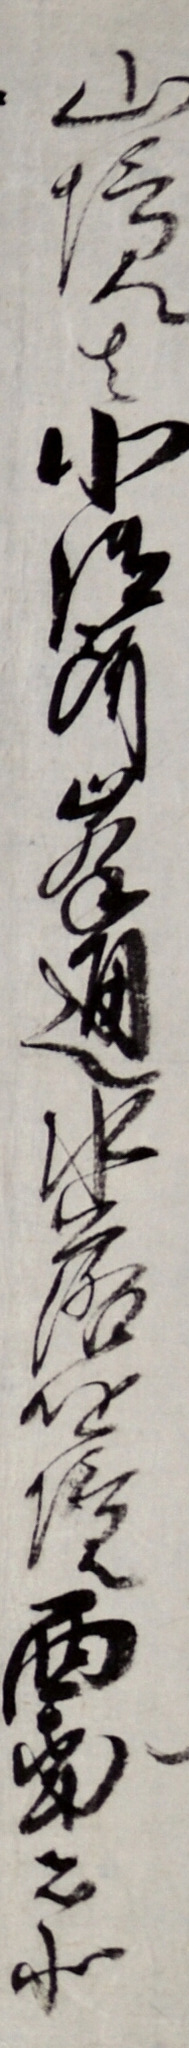山境者北御所峯通水落を境西南者北
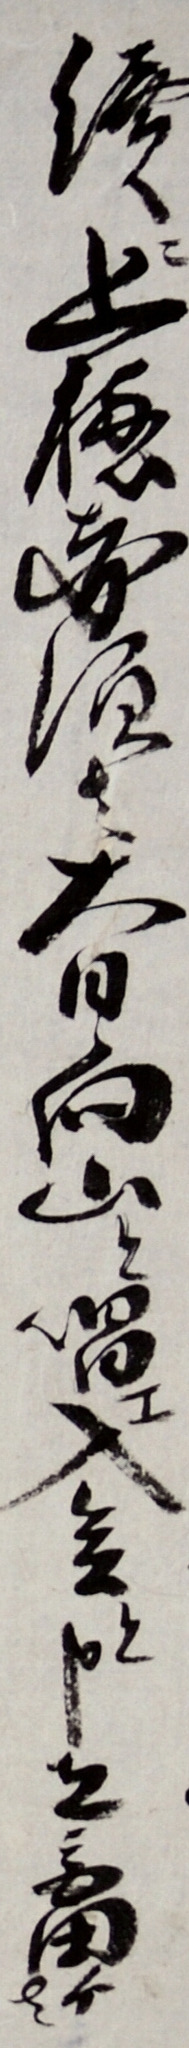續ニ上穂赤須者大日向山と唱ェ入会と申立宮田ゟは
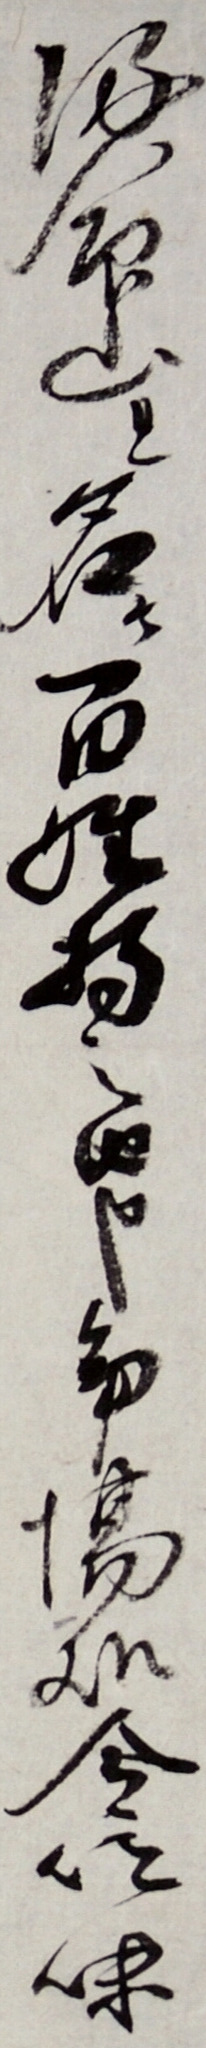帰命山と名ヶ百姓持之由申争場処令吟味
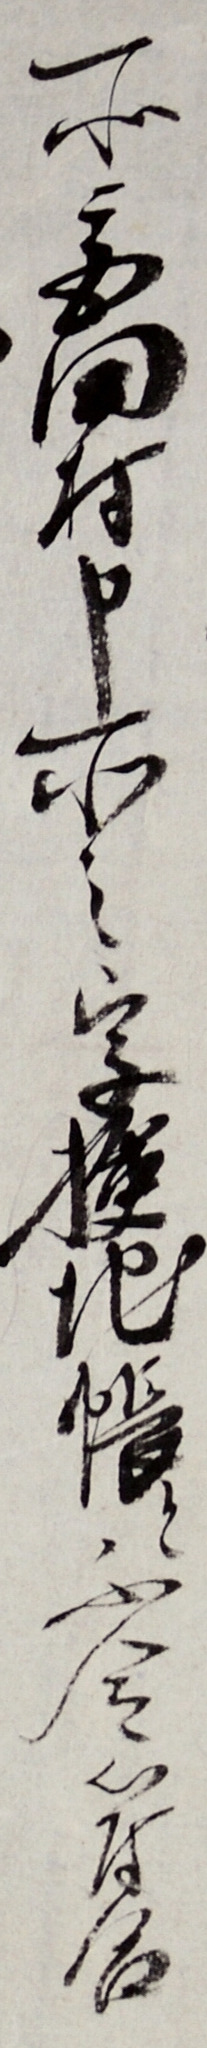所宮田村申所之字検地帳と不令符合
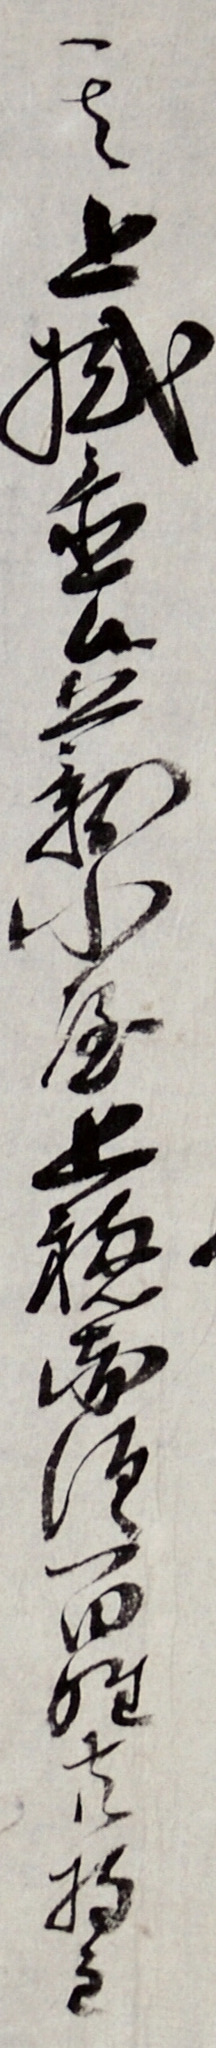其上掛置候薪小屋上穂赤須百姓共持主
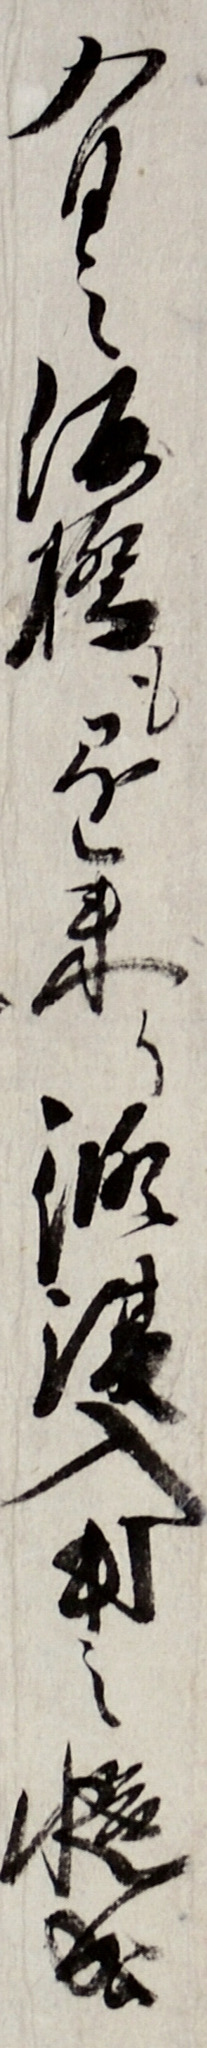有之仮橋も懸来り修復入用之慥成
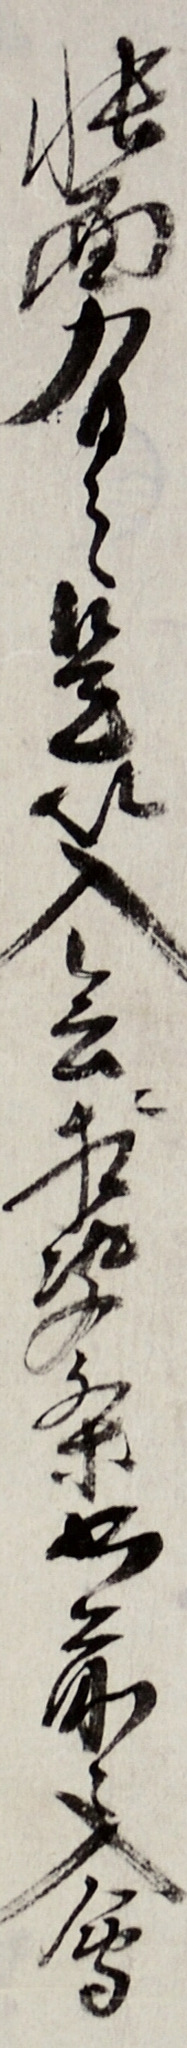帳面有之是以入会ニ相決条書前ニ入会
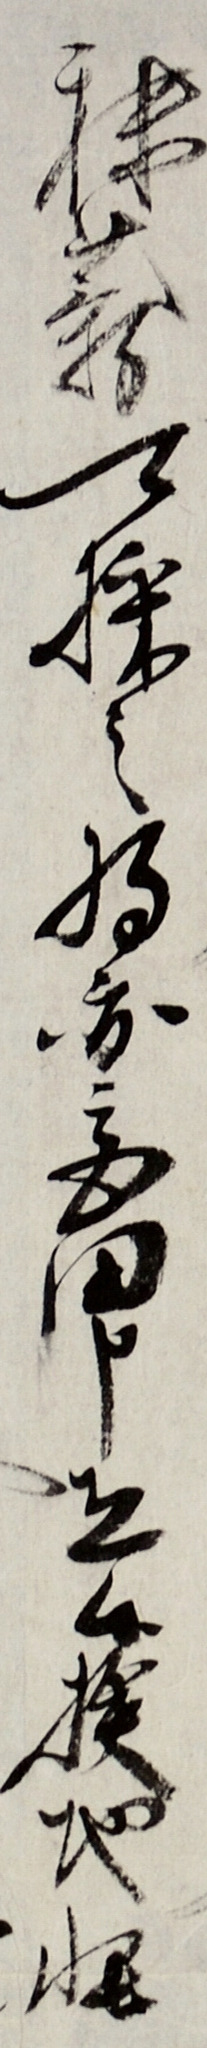秣薪可採之将亦宮田申立候検地帳
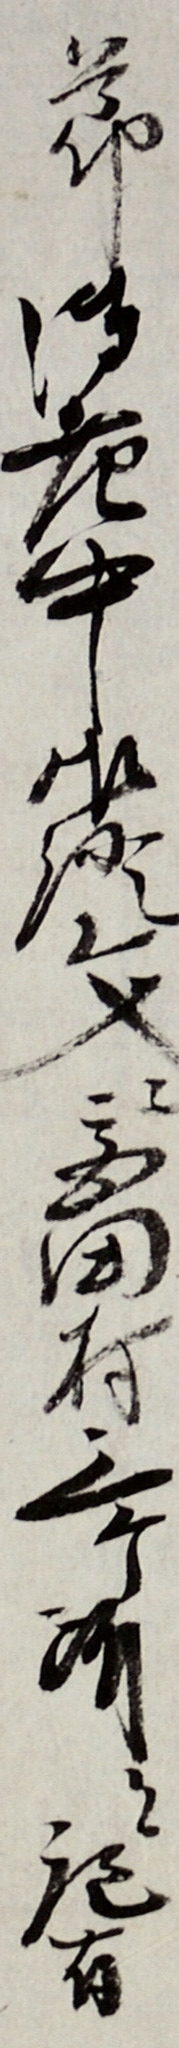節御老中御證文ニ宮田村三ヶ所と記有
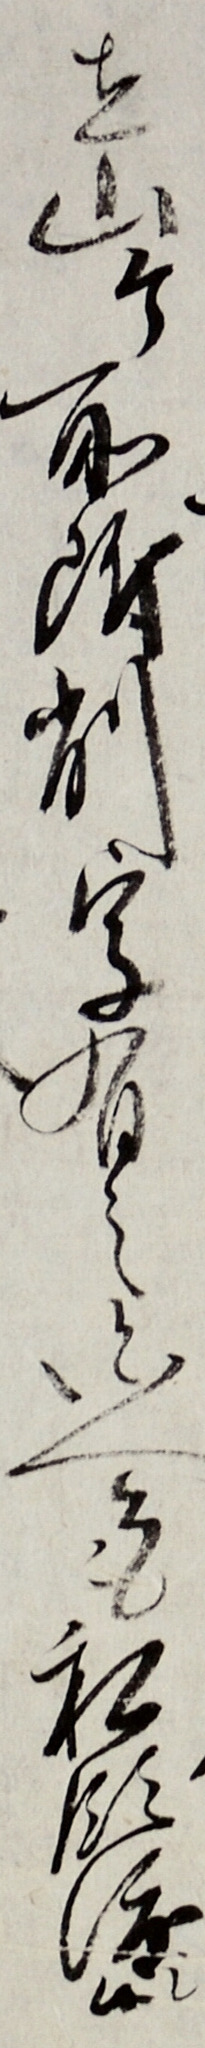は山ヶ所附削字有之といへとも私領渡し候
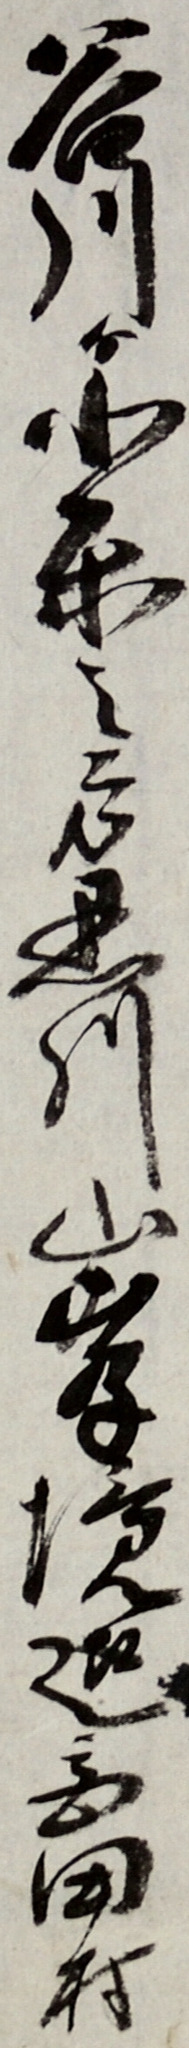谷川ゟ北東之方黒川山峯境迄宮田村
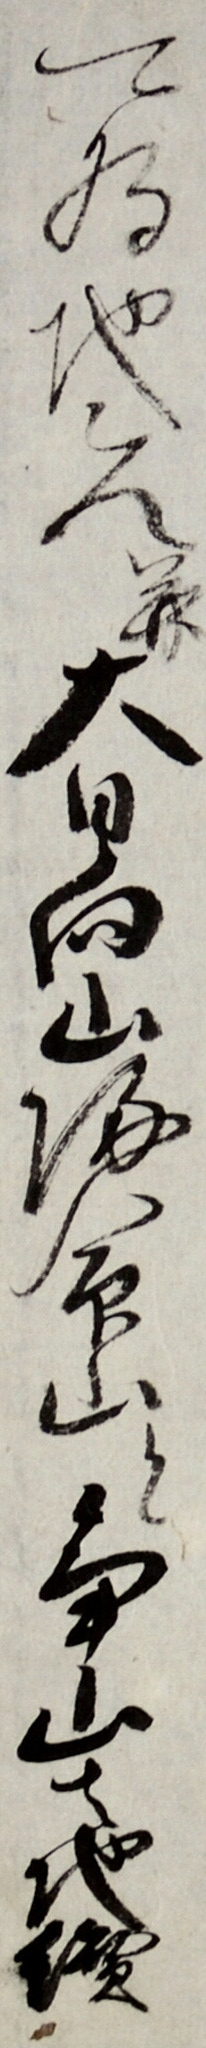可為地元幷大日向山帰命山と争山者地續
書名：赤穂宮田山論裁許状
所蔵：伊那市立高遠町図書館・合同会社AMANE
